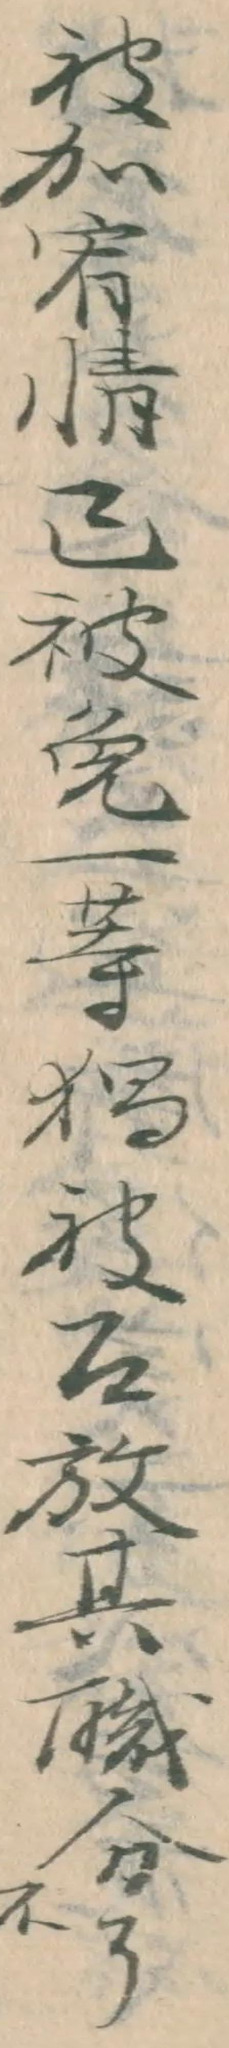被加宥情己被免一等独被召放其職分了
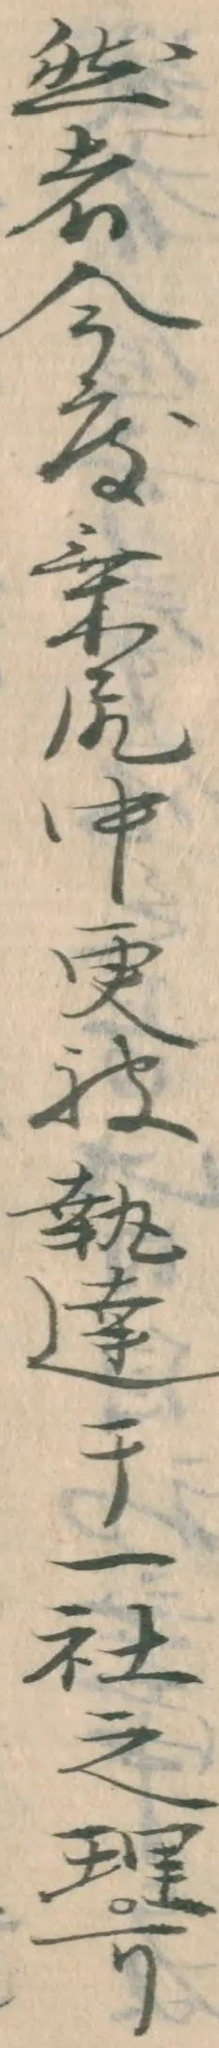然者今度乗尻中更被執達于一社之理◦可
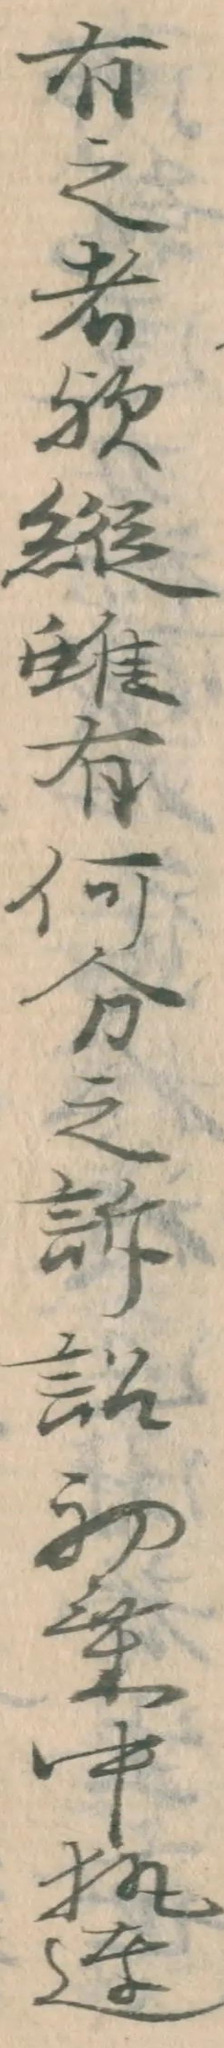有之者歟縦雖有何分之訴詔初乗中執達
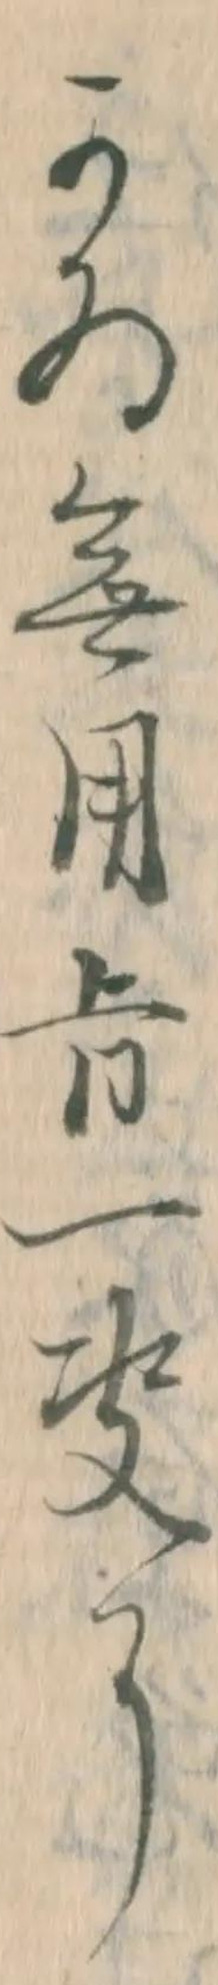可為無用旨一決了
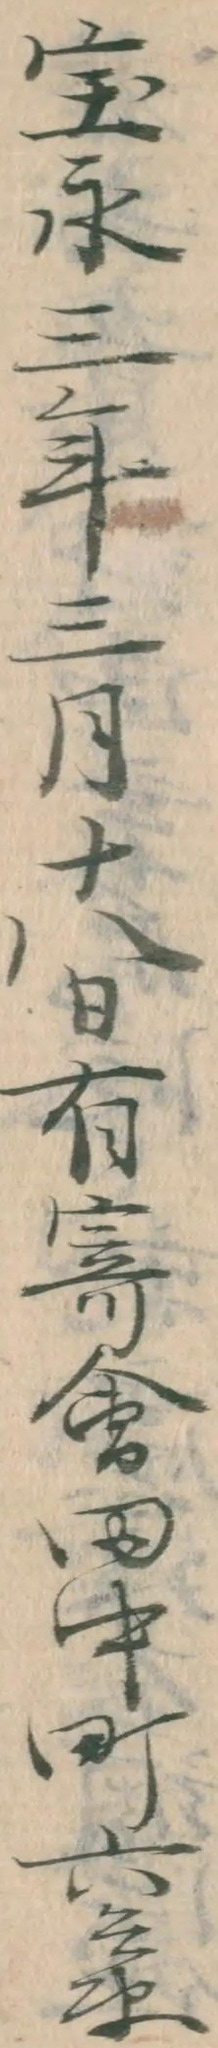宝永三年三月十八日有寄会田中町六兵衛
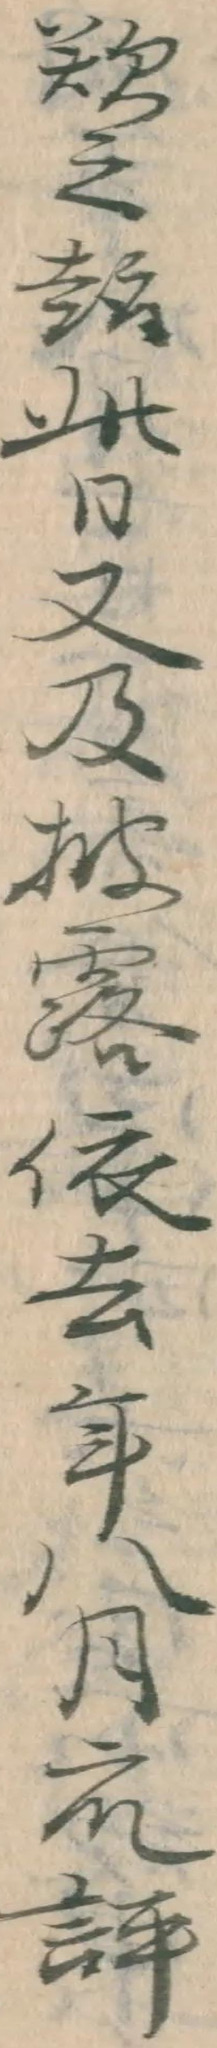歎之趣此日又及披露依去年八月衆評
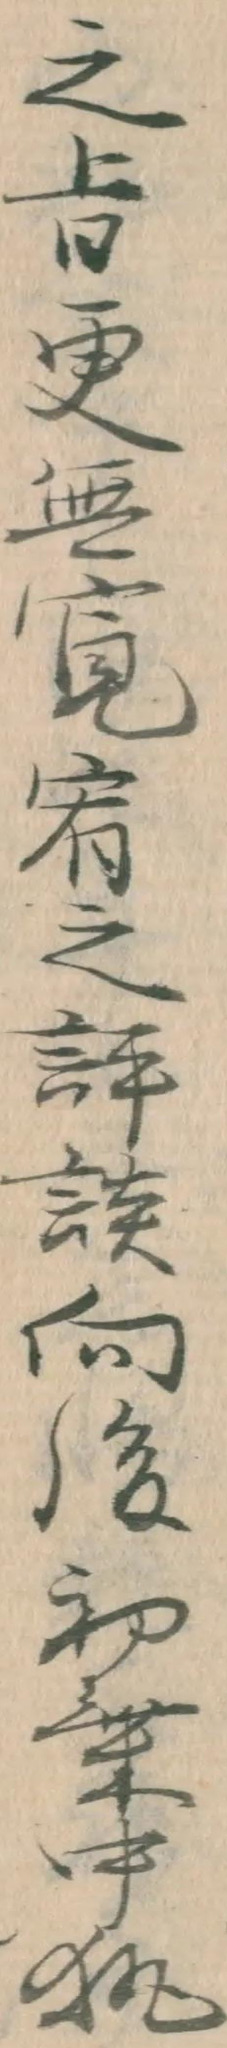之旨更無寛宥之評談向後初乗中執
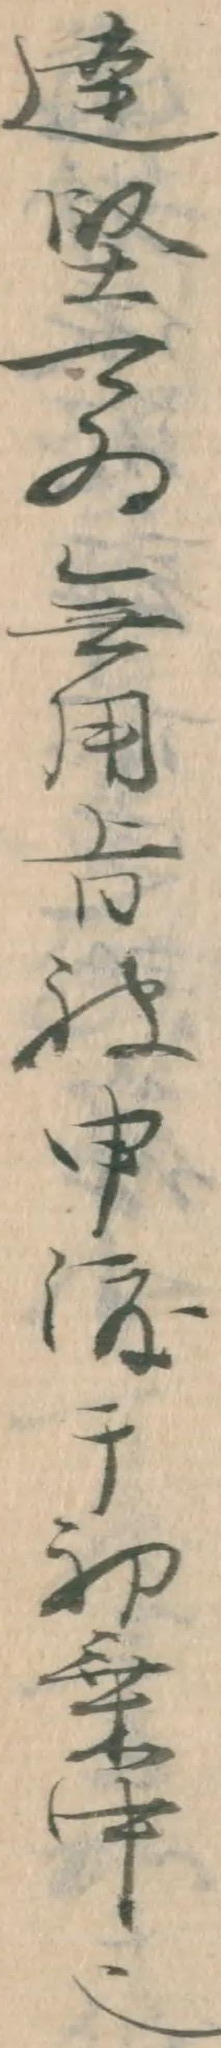達堅可為無用旨被申渡于初乗中也
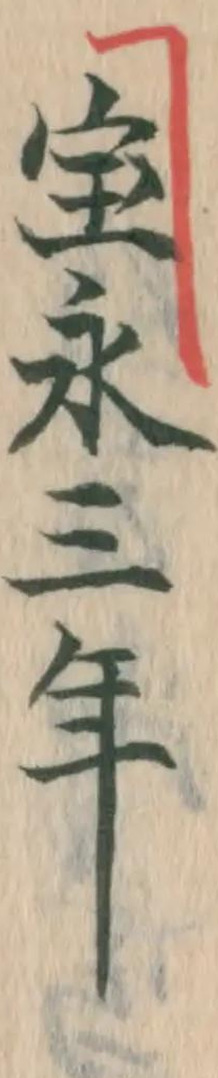宝永三年
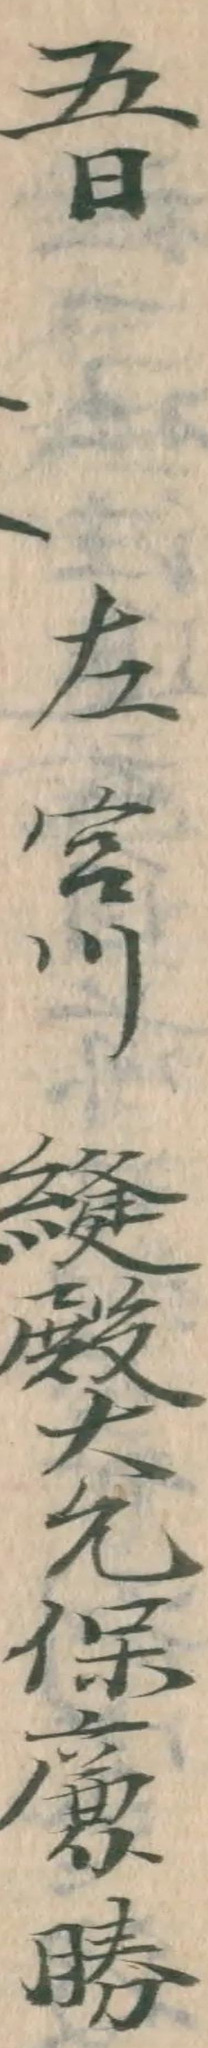左宮川縫殿大允保廉勝
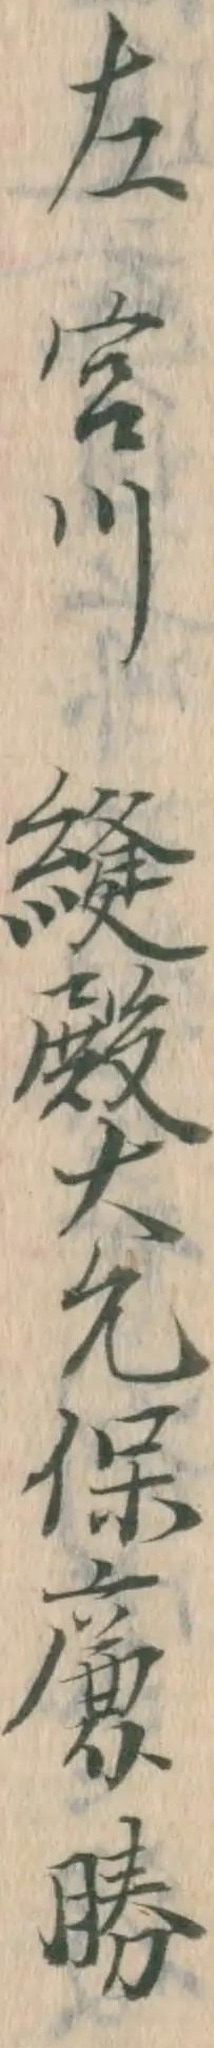左宮川縫殿大允保廉勝
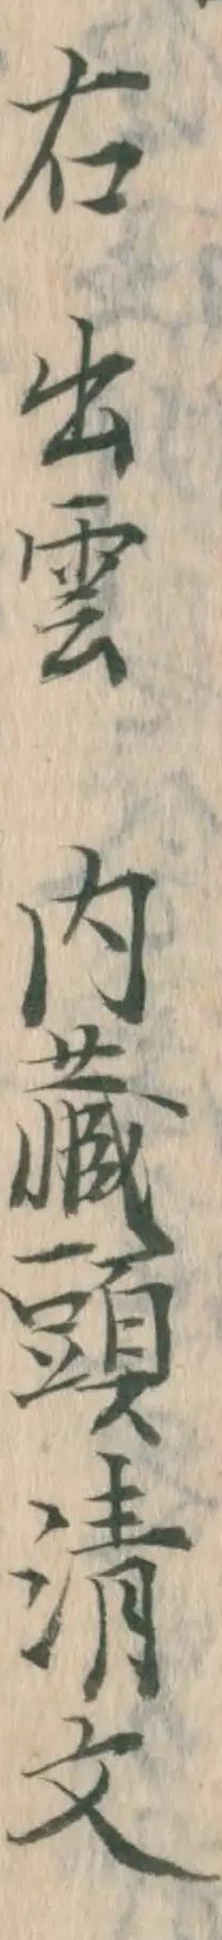右出雲内蔵頭清文
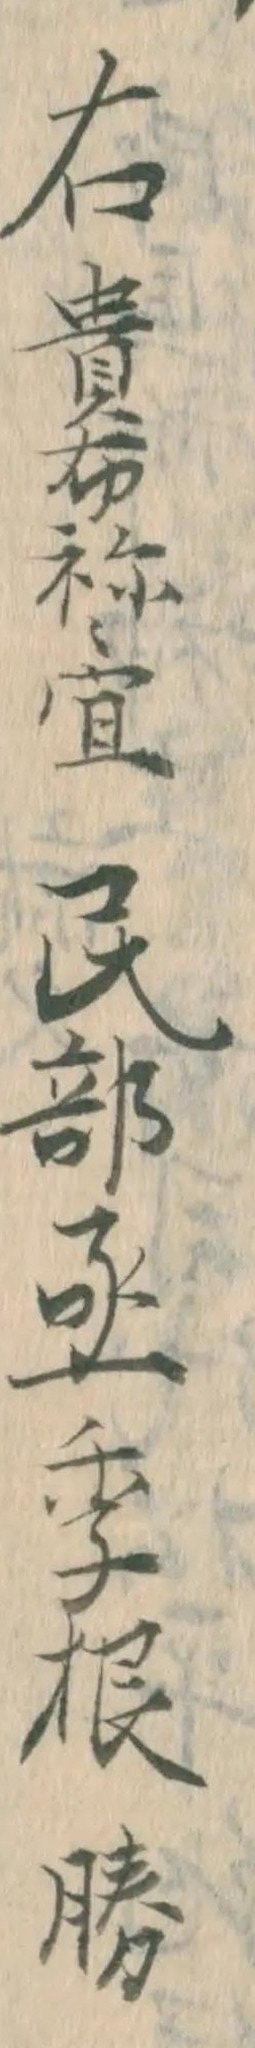右貴布祢々宜民部丞季根勝

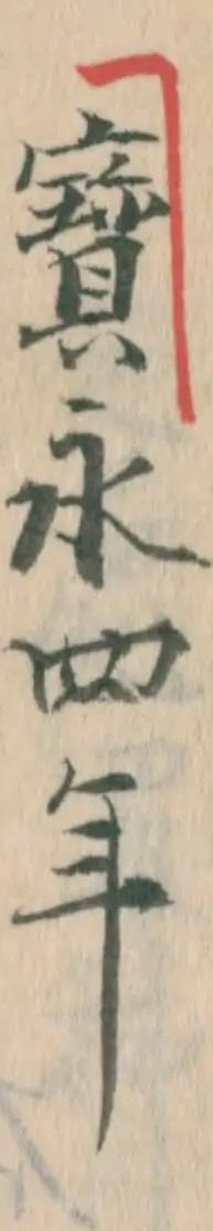宝永四年
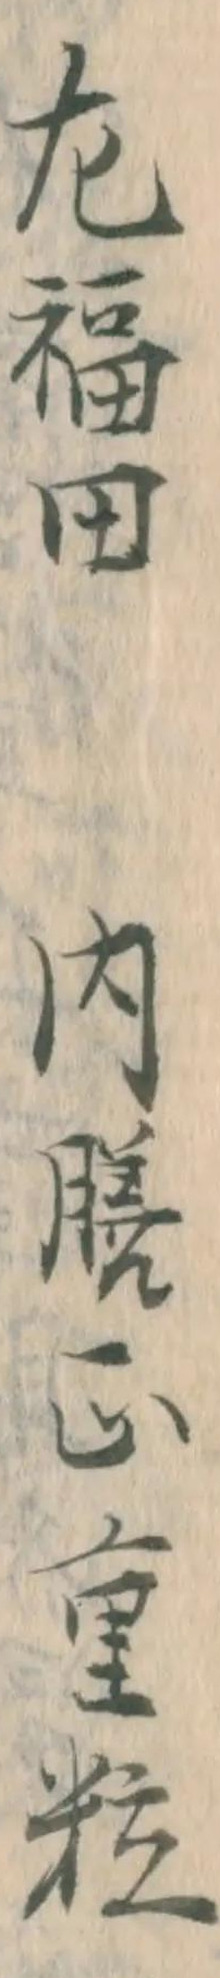左福田内膳正重粒
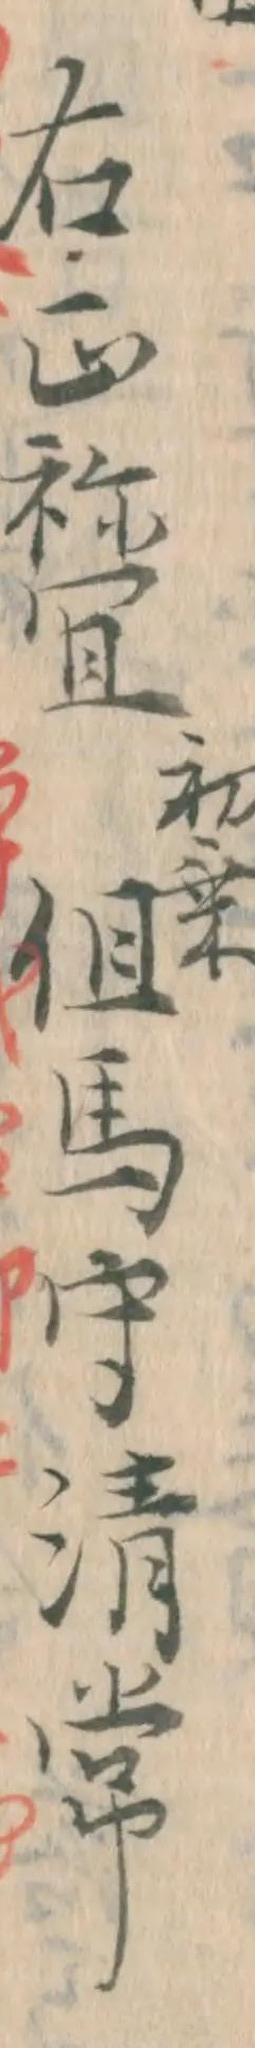右正称宜但馬守清常
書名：賀茂社記録. 第10冊
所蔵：国立国会図書館 National Diet Library, JAPAN
